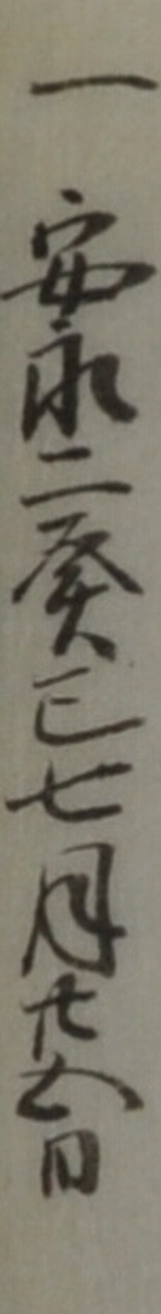一安永二癸巳七月廿五日
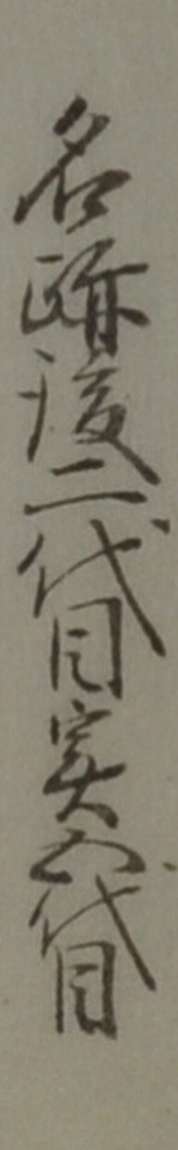名跡後二代目実五代目
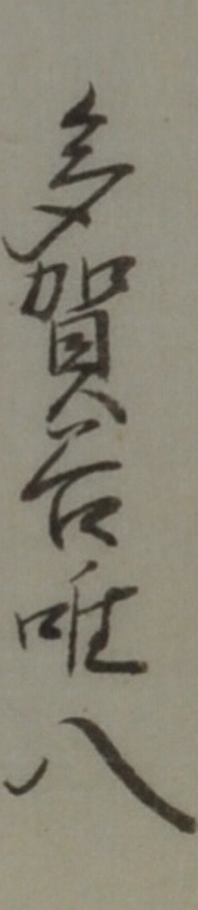多賀谷唯八
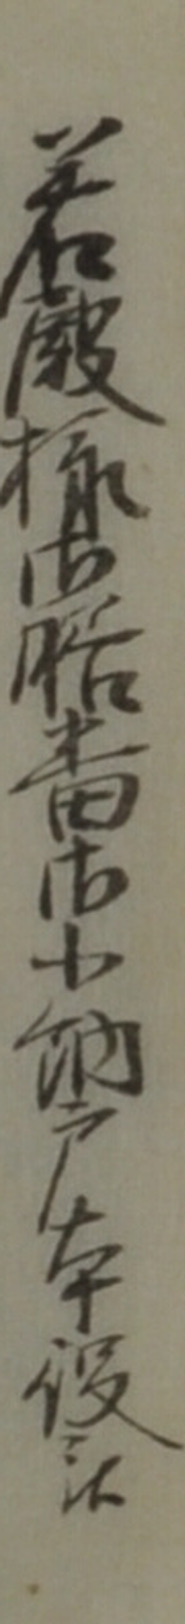若殿様御膳番御小納戸本役被
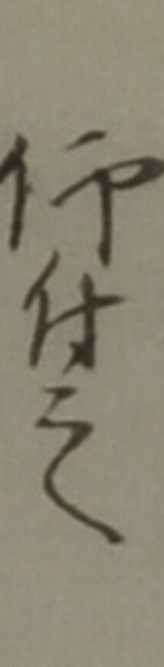仰付之
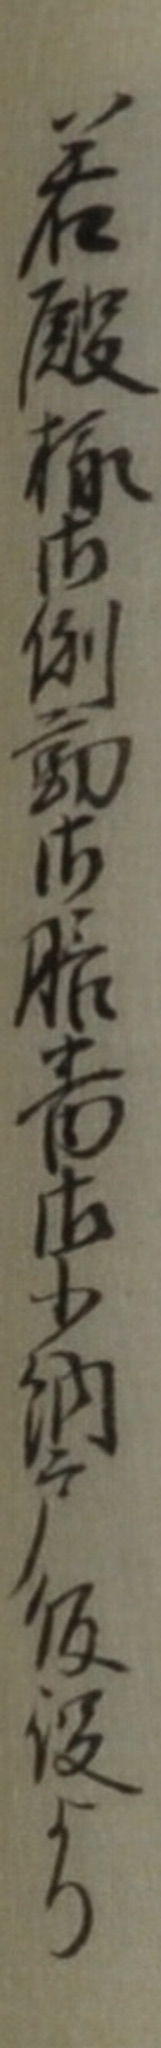若殿様御側勤御膳番御小納戸仮役より
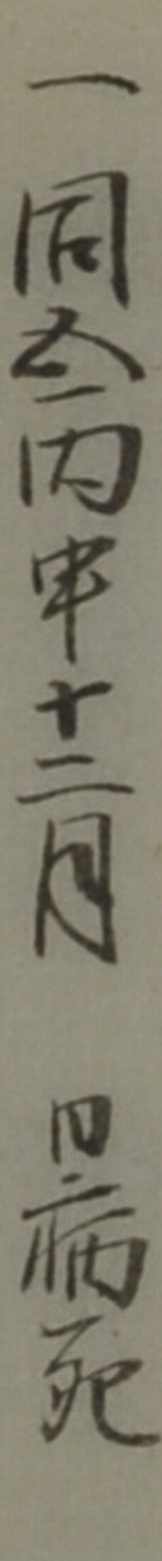一同五丙甲十二月日病死
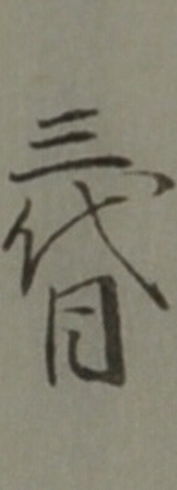三代目
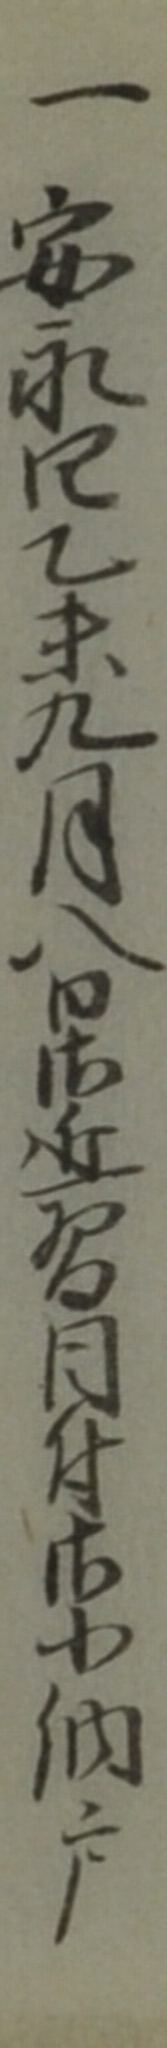一安永四乙未九月八日御近習目付御小納戸
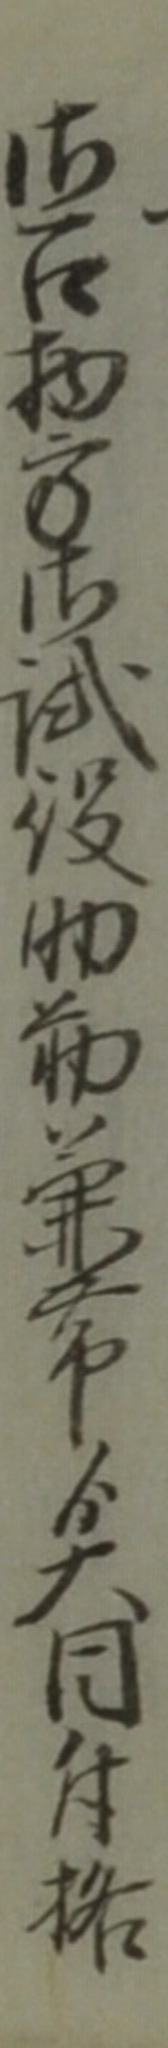御召物方御試役助勤兼帯ゟ大目付格
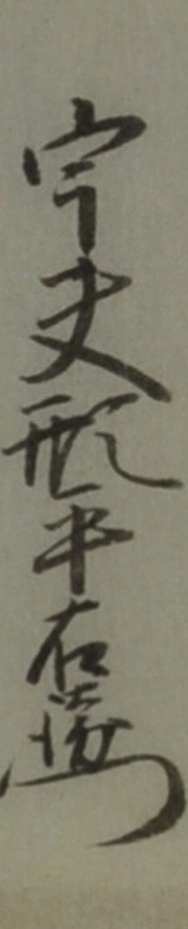宇夫形平右衛門
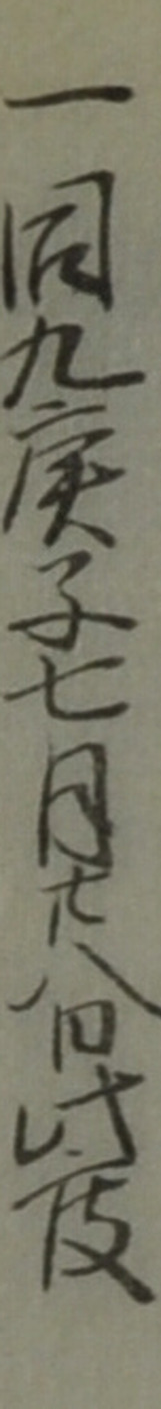一同九庚子七月廿八日此度
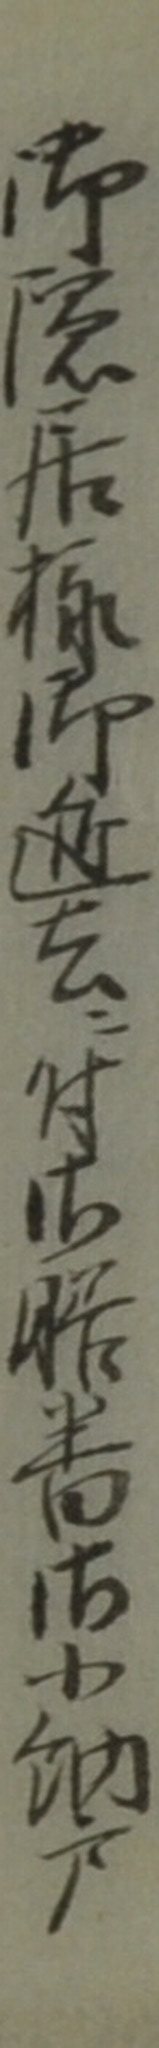御隠居様御逝去ニ付御膳番御小納戸
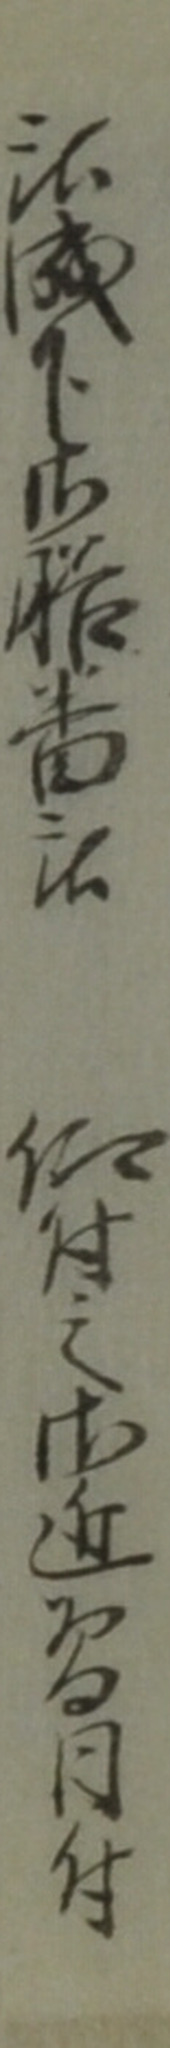被成下御膳被仰付之御近習目付
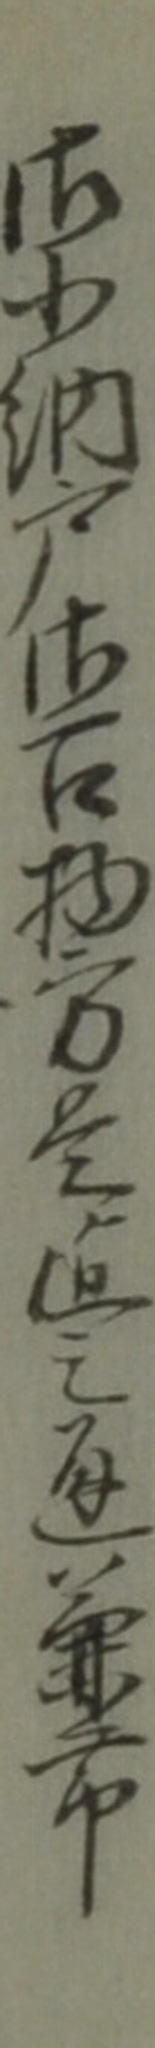御小納戸御召物方是迄之通兼帯
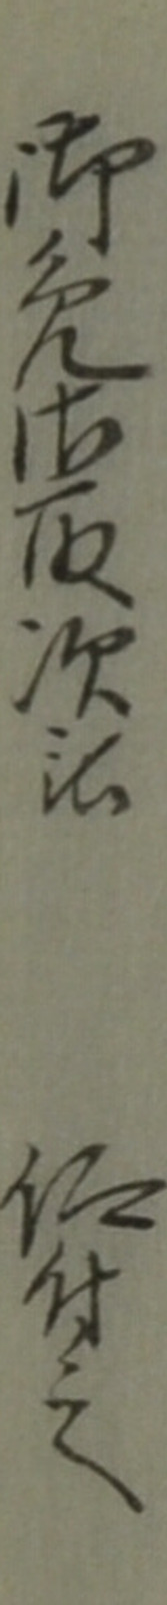御免御取次被仰付之
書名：諸御役代々録（四）
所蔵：伊那市立高遠町図書館・合同会社AMANE
